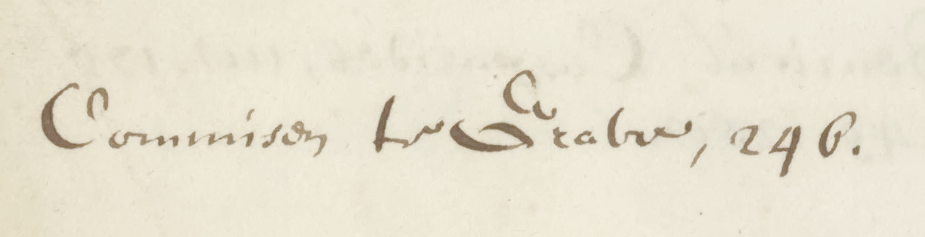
Commisen te Grave, 246.
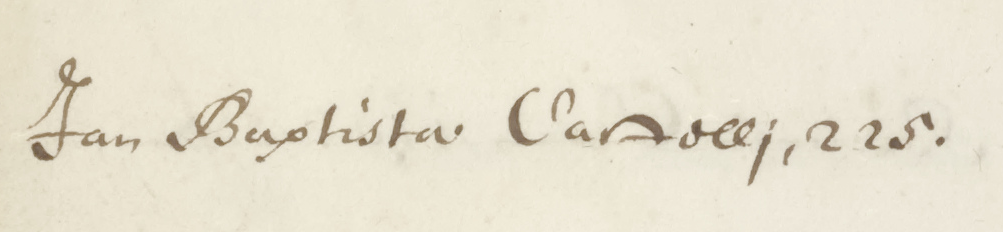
Jan Baptista Castelli, 225
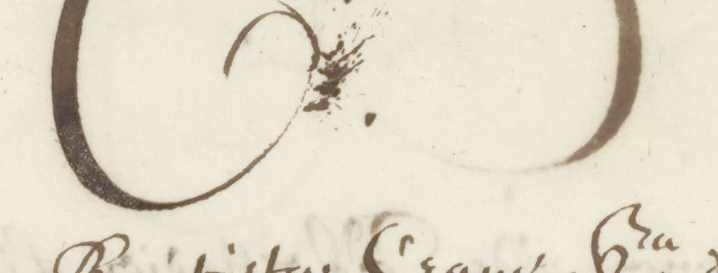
C
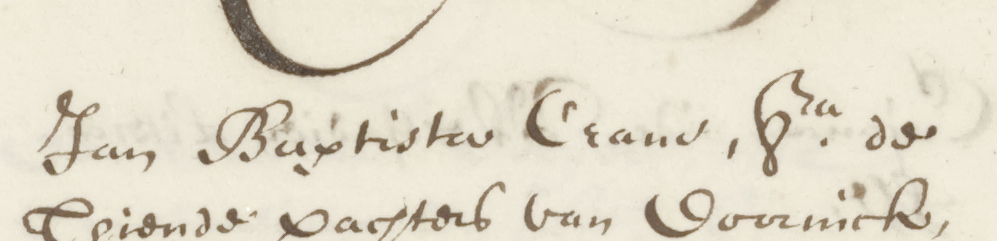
Jan Baptista Crane, ca. de
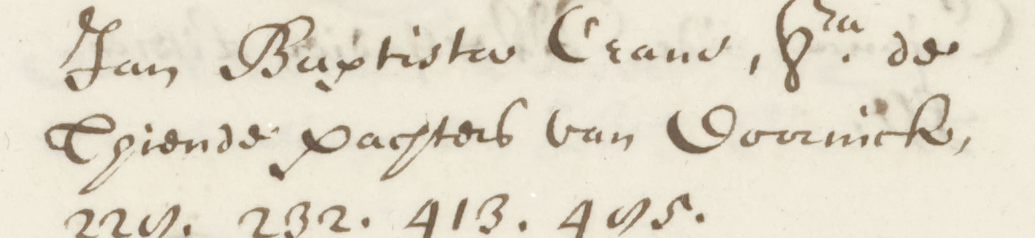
Thiende pachters van Doornick,
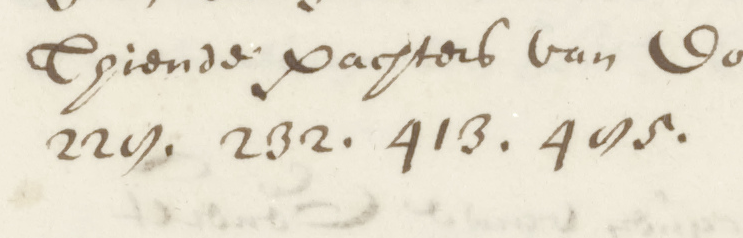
228, 232, 413, 485.
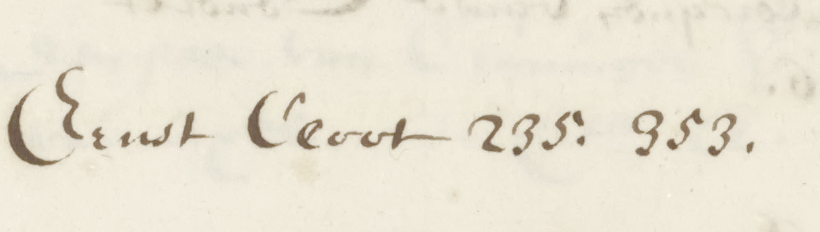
Ernst Cloot 235, 353.
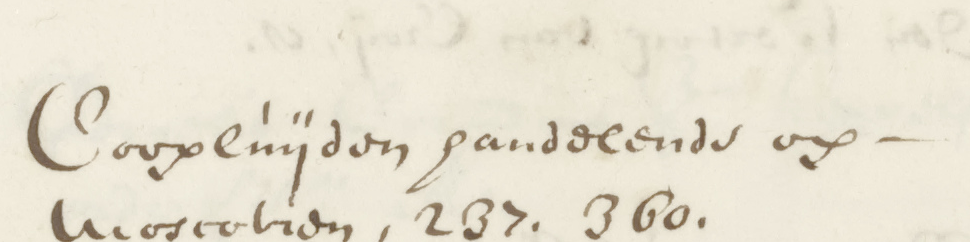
Coopluijden handelende op -
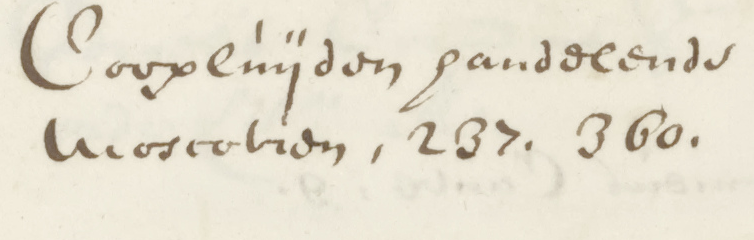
Moscovien, 237, 360.
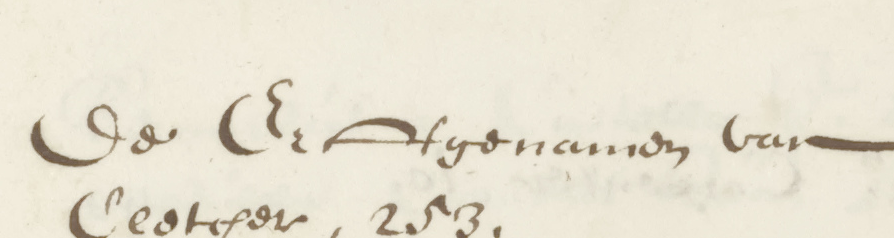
De Erffgenamen van
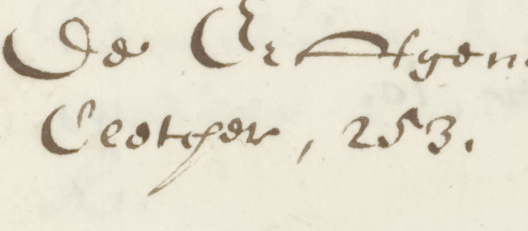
Cletcher, 253.
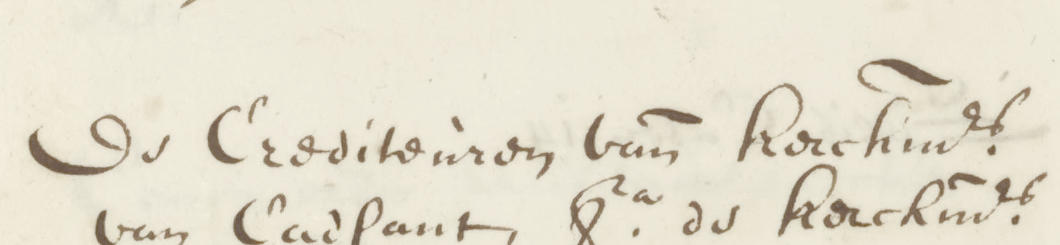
De Crediteuren van kerckmrs.
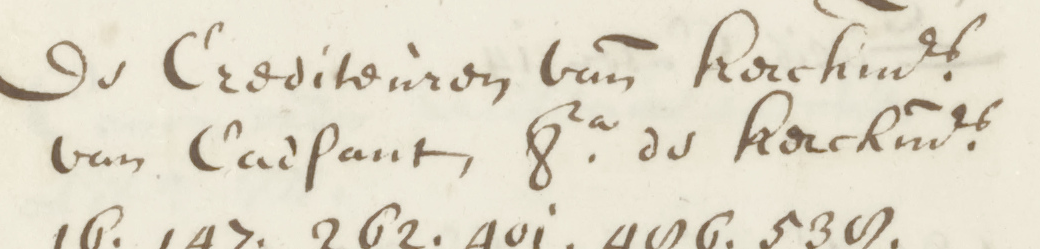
van Cadsant, ca. de kerckmrs.
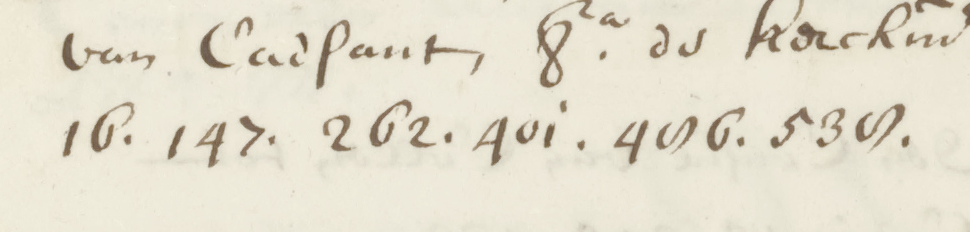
16, 147, 262, 401, 486, 538.
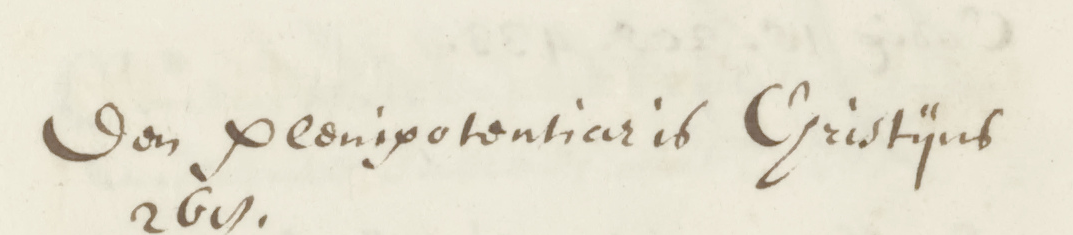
Den plenipotentiaris Cristijns
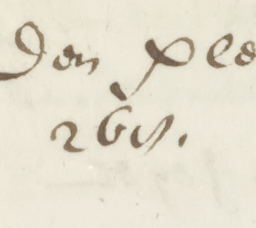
268.
